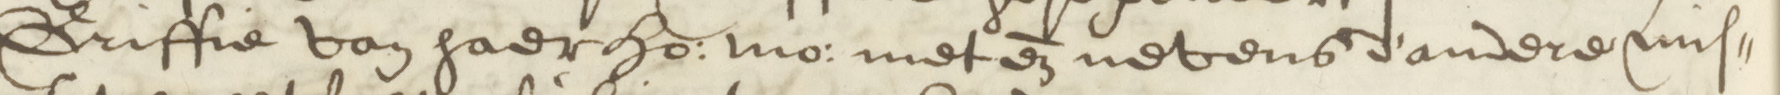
Griffie van haer Ho:Mo: met en nevens d‛andere mis„
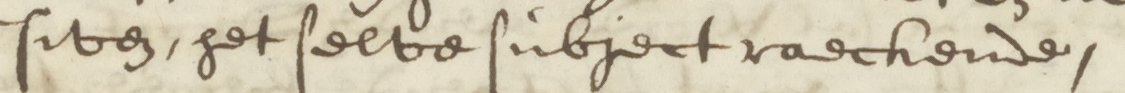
siven, het selve subject raeckende.
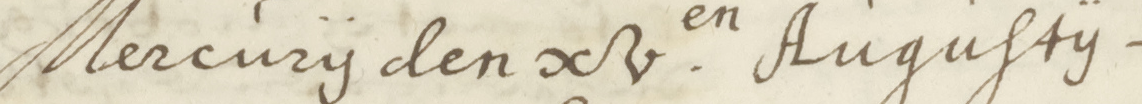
Mercurij den XVen Augustij
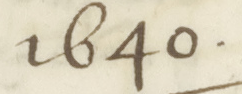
1640.
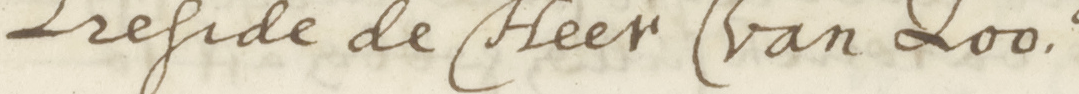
Preside de Heer van Loo.
